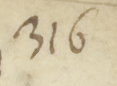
316
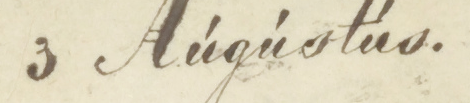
3 Augustus.
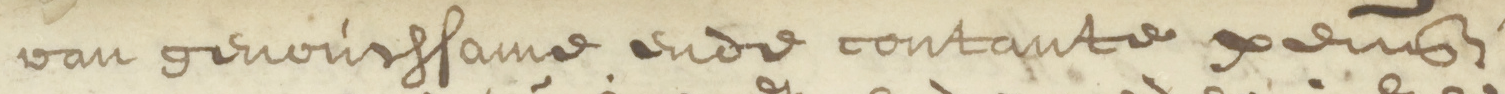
van genouchsame ende contante penn
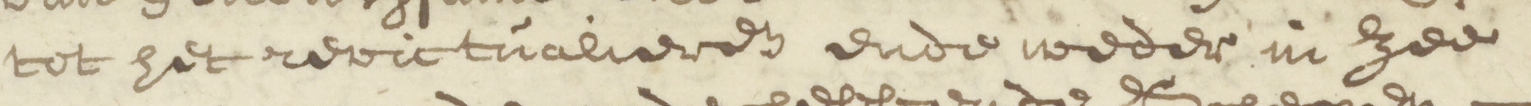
tot het revictualieren ende weder in Zee
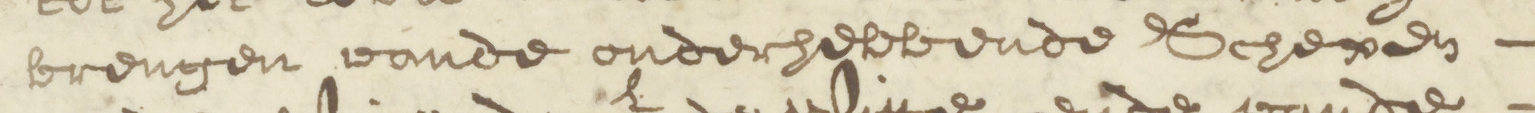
brengen vande onderhebbende Schepen -
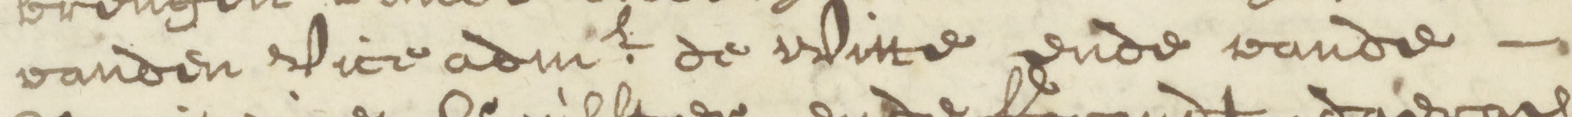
vanden Vice adml. de Witte ende vande —
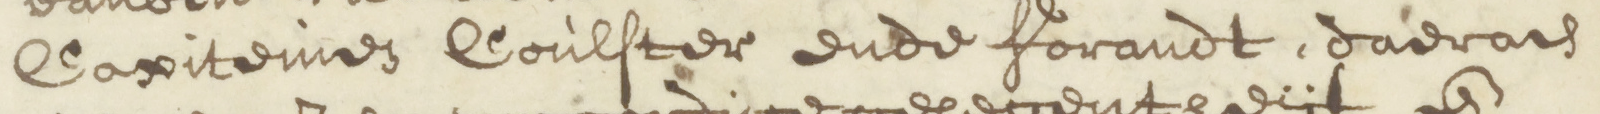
Capiteinen Coulster ende Forandt, daeraen
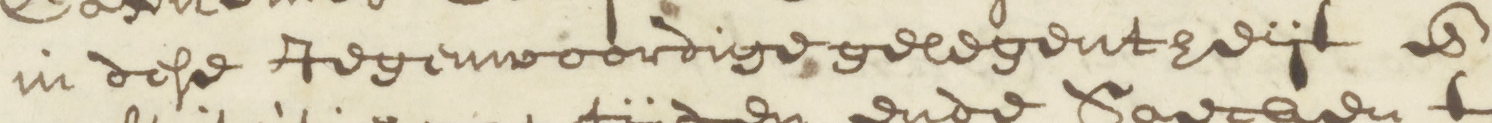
in dese Jegenwoordige gelegentheijt en
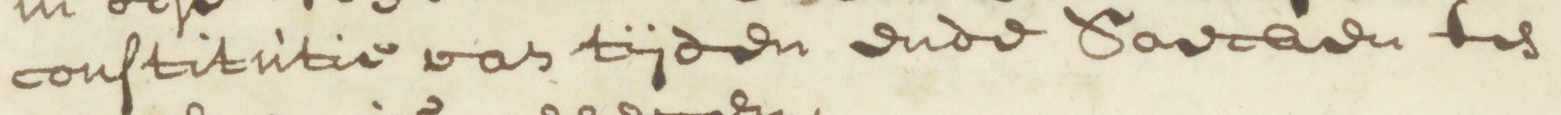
constitutie van tijden ende Saecken ten
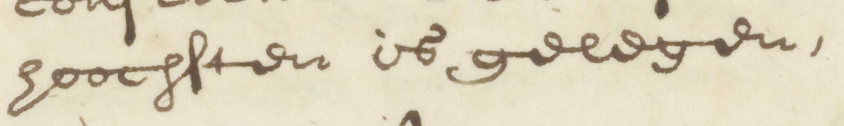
hoochsten is gelegen.
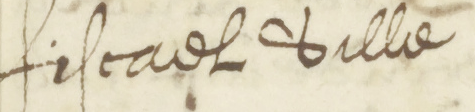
fiscael Sille
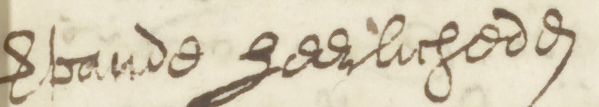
vpande heerlicheden
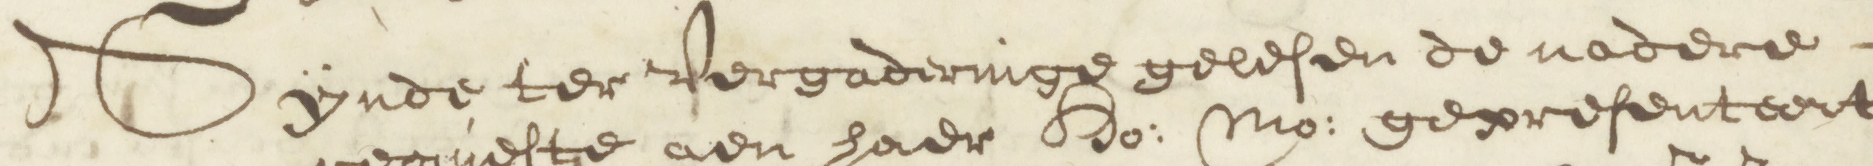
Sijnde ter Vergaderinge gelesen de nadere
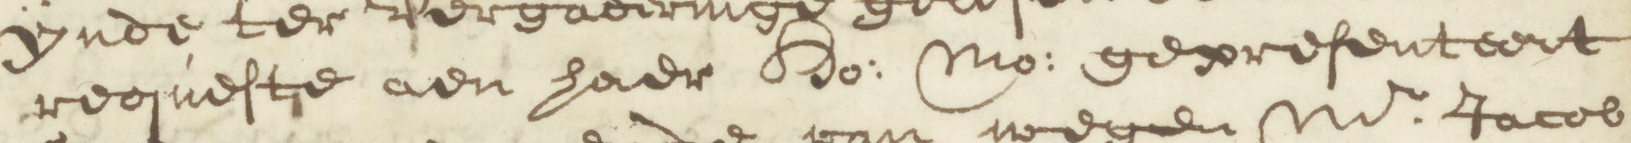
requeste aen haer Ho:Mo: gepresenteert
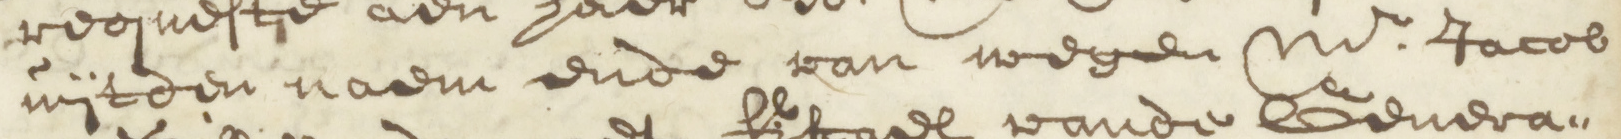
uijt den naem ende van wegen Mr. Jacob
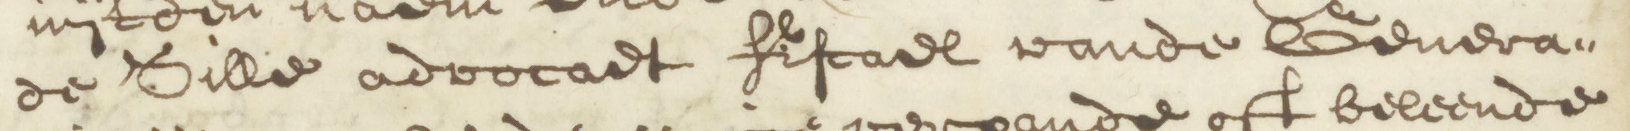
de Sille advocaet Fiscael vande Genera„
